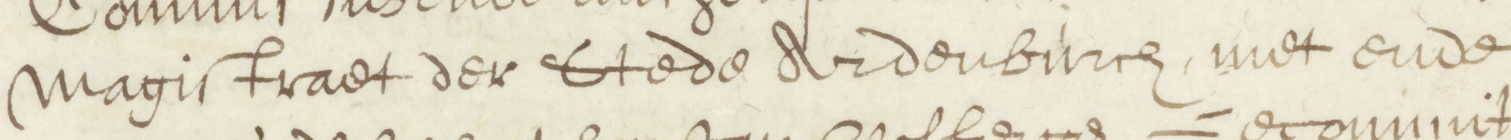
Magistraet der Stede Ardenburch, met ende
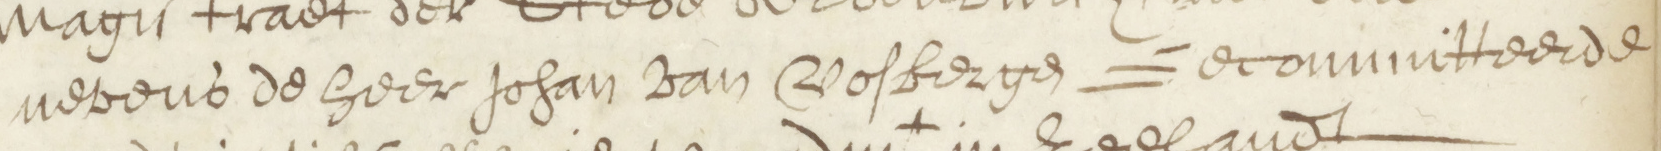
nevens de heer Johan van Vosbergen Gecommitteerde
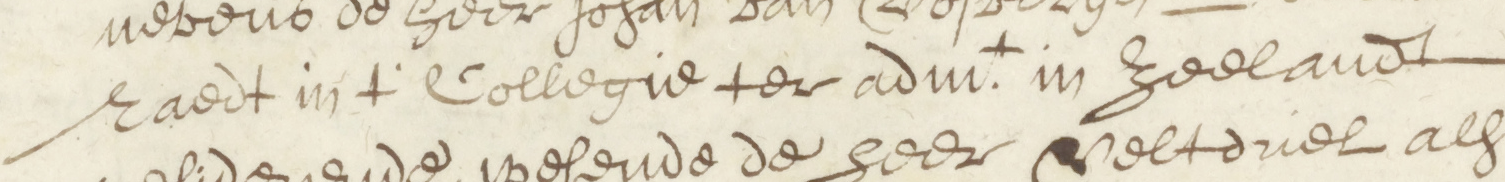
raedt in t' Collegie ter Admt. in Zeelandt
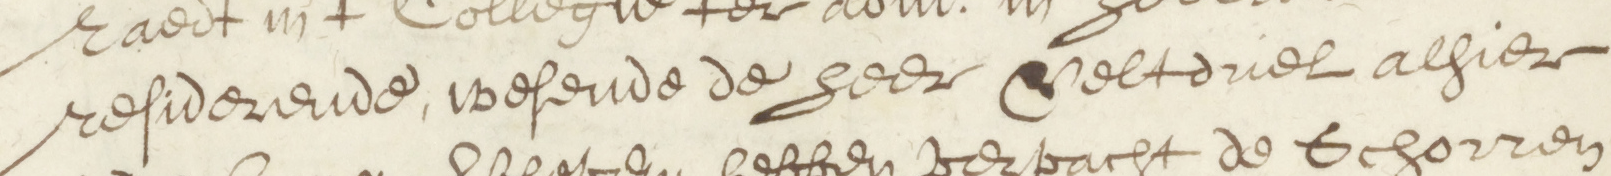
residerende, wesende de heer Veltdriel alhier
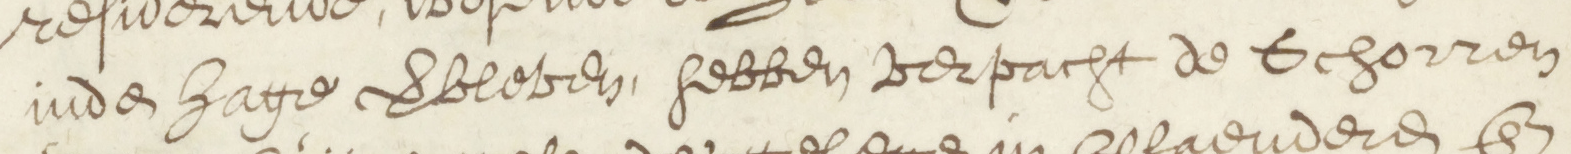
inden Hage vbleven, hebben verpacht de Schorren
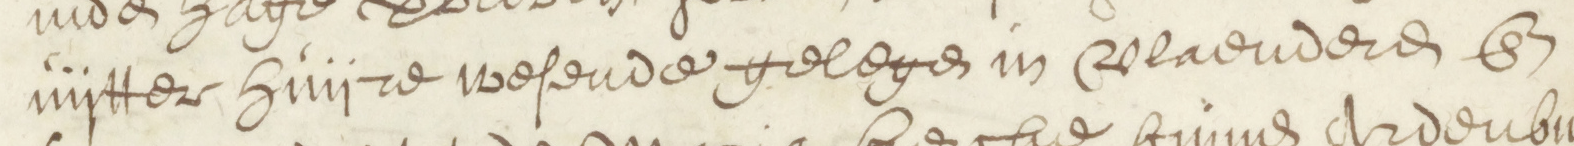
uijtter huijre wesende gelegen in Vlaenderen &
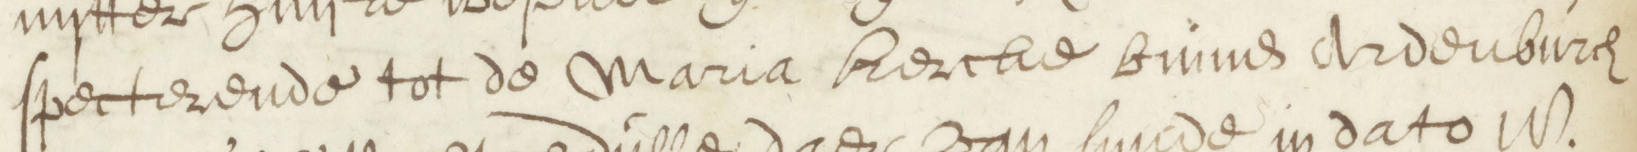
specterende tot de Maria kercke binnen Ardenburch
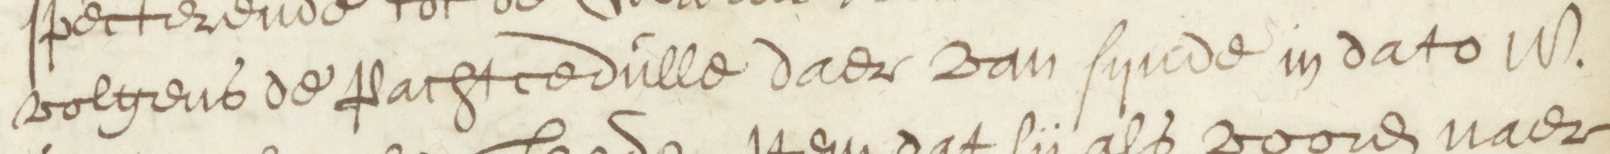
volgens de Pachtcedulle daer van synde in dato 18.
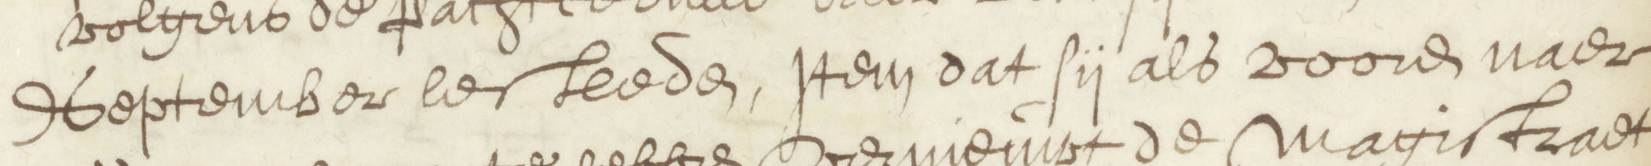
September lestleden, Item dat sij als vooren naer
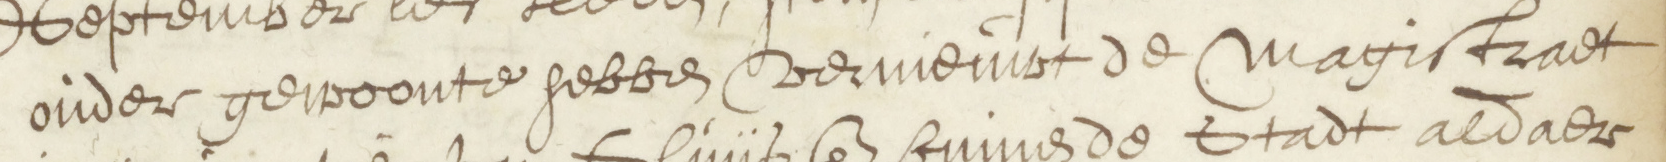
ouder gewoonte hebben vernieuwt de magistraet
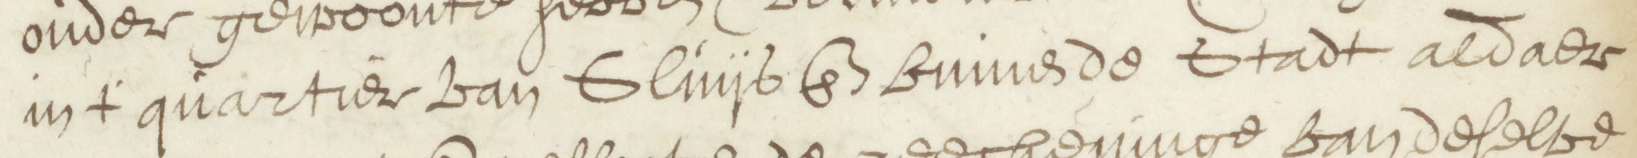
in t'quartier van Sluijs & binnen de Stadt aldaer
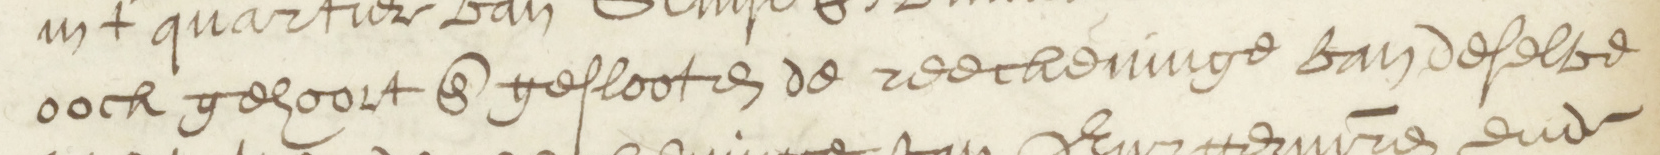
oock gehoort & geslooten de reeckeninge van deselve
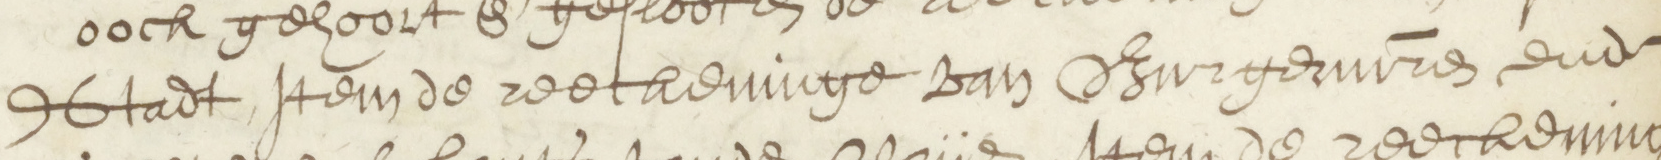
Stadt, Item de reeckeninge van Burgermren ende
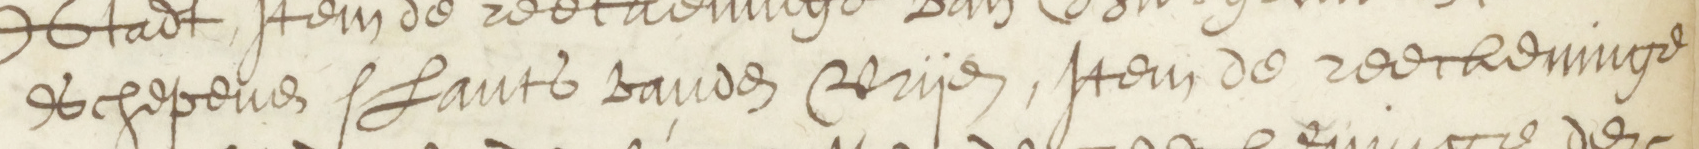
Schepenen sLants vanden Vrijen, Item de reeckeninge
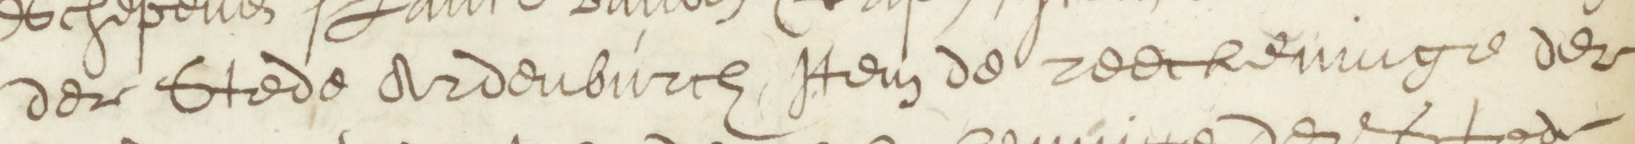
der Stede Ardenburch, Item de reeckeninge der
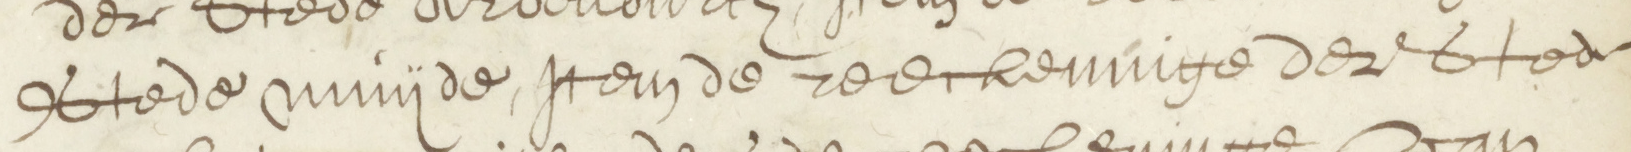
Stede Muijde, Item de reeckeninge der Stede
